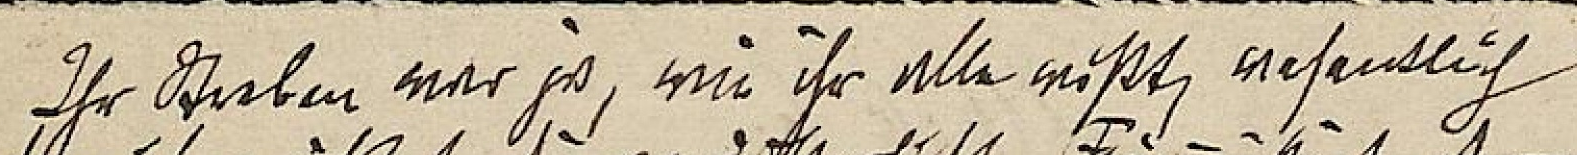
Ihr Streben war ja, wie ihr alle wißt, wesentlich
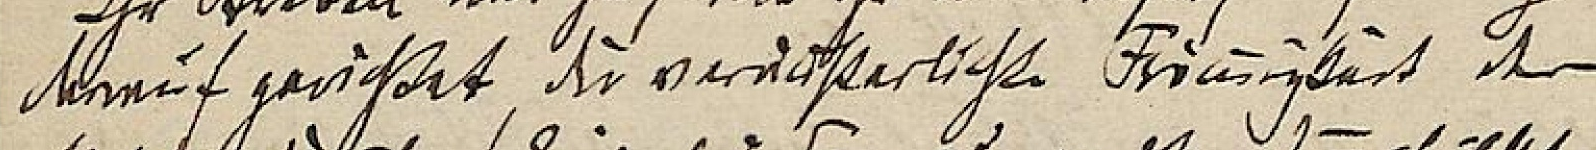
darauf gerichtet, die veräußerlichte Frömigkeit der
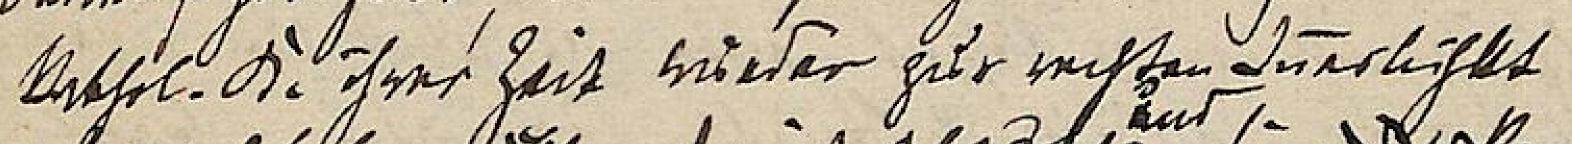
kathol. K. ihrer Zeit wieder zur rechten Inerlichkeit
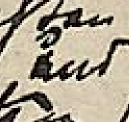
und
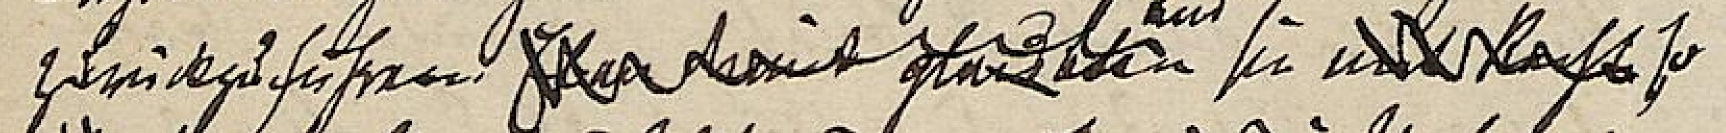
zurückzuführen. Eben damit glauben sie mit Recht so
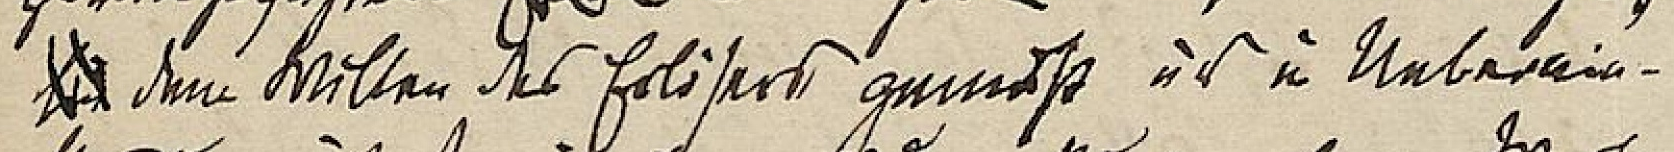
für dem Willen des Erlösers gemäß und in Ueberein¬
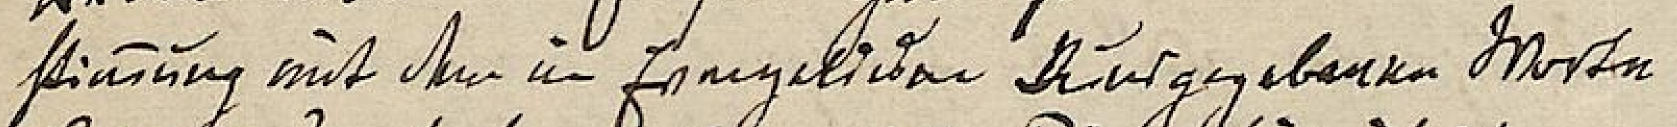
stimmung mit dem im Evangelischen kundgegebenen Worte
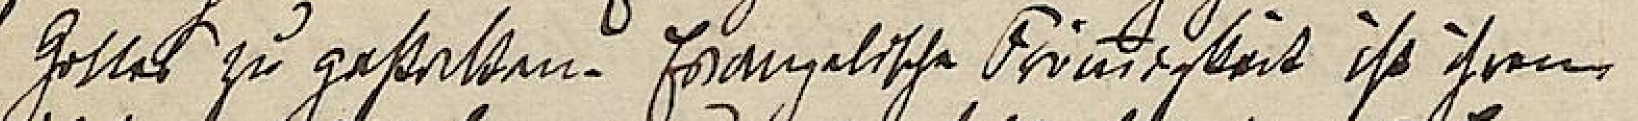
Gottes zu gestatlten. Evangelische Frömigkeit ist ihrem
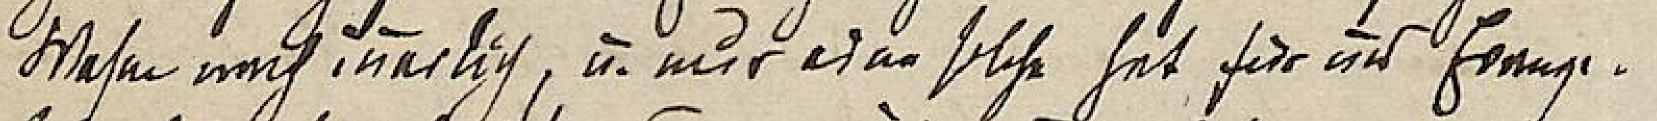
Wesen nach inerlich, u. nur eine solche hat für uns Evange¬
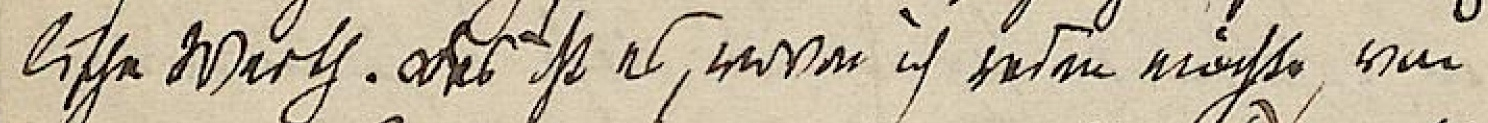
lische Werth. Das ist es, wovon ich reden möchte, von
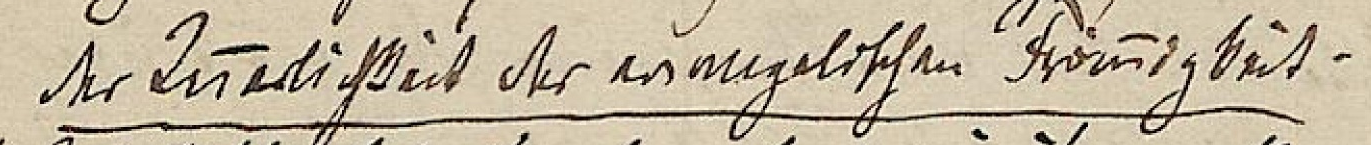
der Inerlichkeit der evangelischen Frömigkeit.
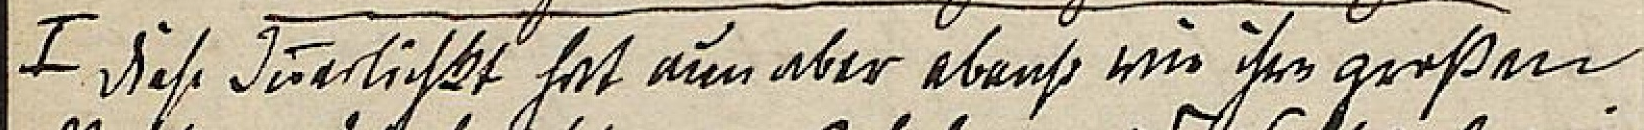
I Diese Inerlichkt hat nun aber ebenso wie ihre großen
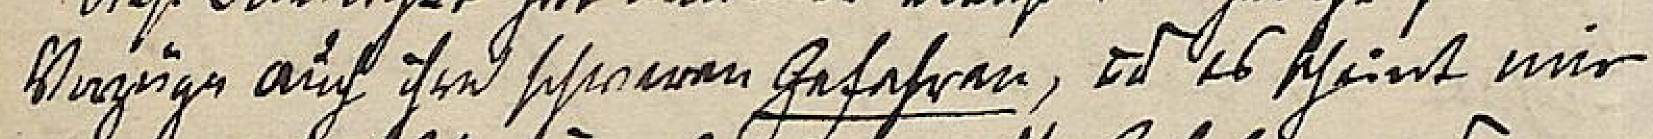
Vorzüge auch ihre schweren Gefahren, und es scheint mir
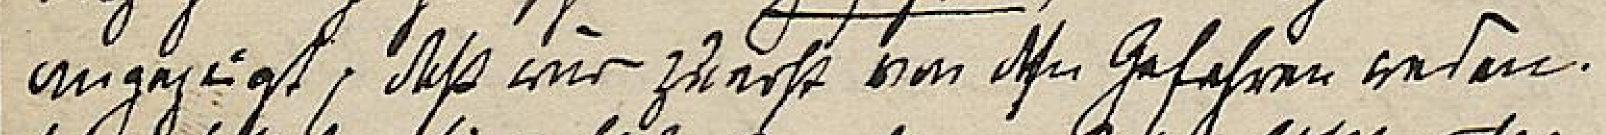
angezeigt, daß wir zuerst von dsn Gefahren reden.
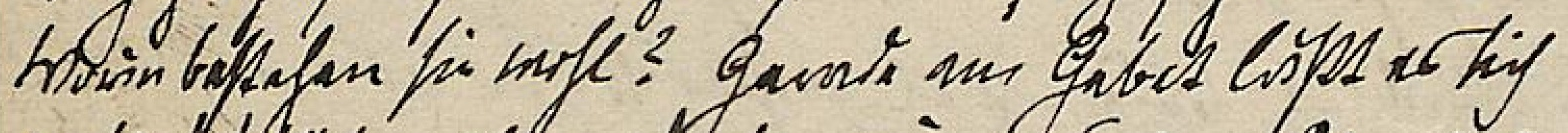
Worin bestehen sie wohl? Gerade am Gebet läßt es sich
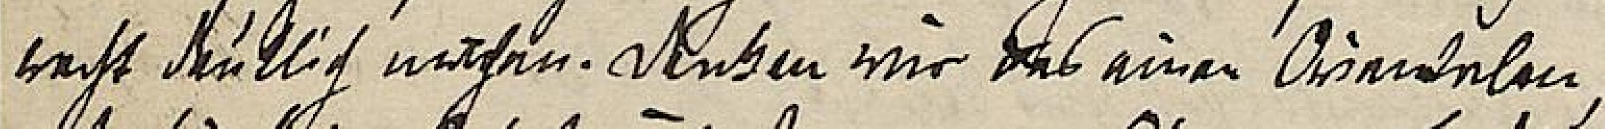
recht deutlich machen. Denken wir uns einen Orientalen,
